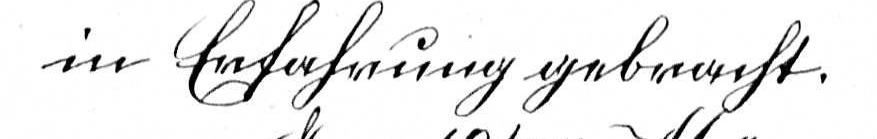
in Erfahrung gebracht.
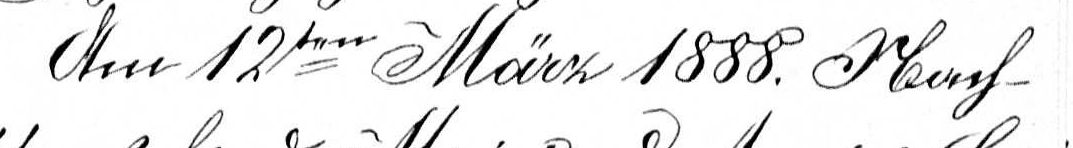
Am 12ten März 1888. Nach¬
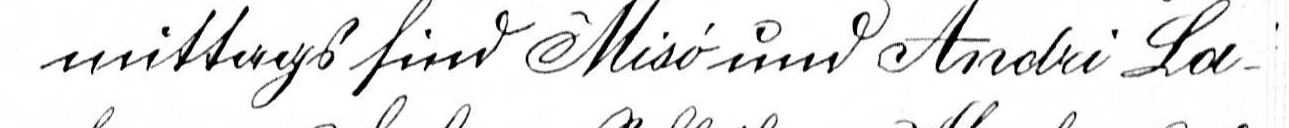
mittags sind Misó und Andri La¬
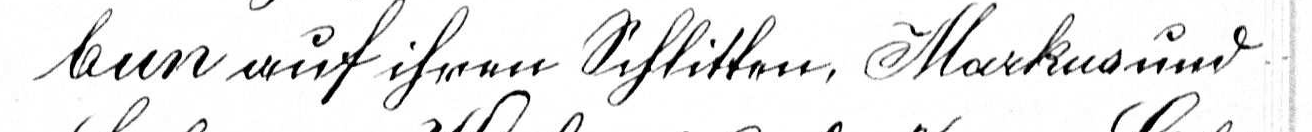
bun auf ihren Schlitten, Markus und
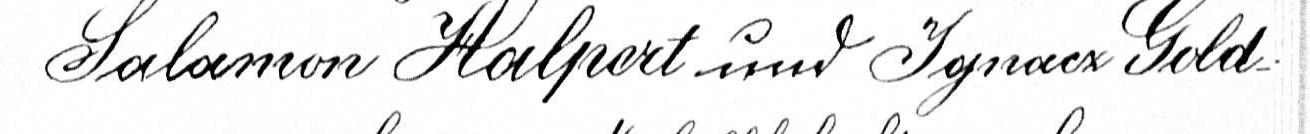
Salamon Halpert und Jgnacz Gold¬
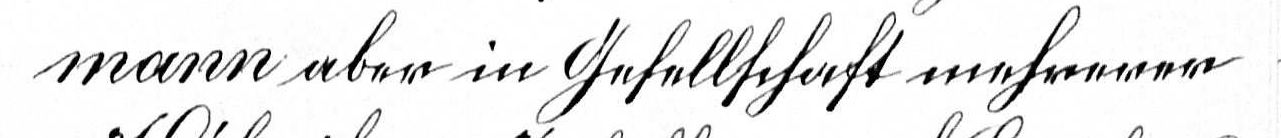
mann aber in Gesellschaft mehrerer
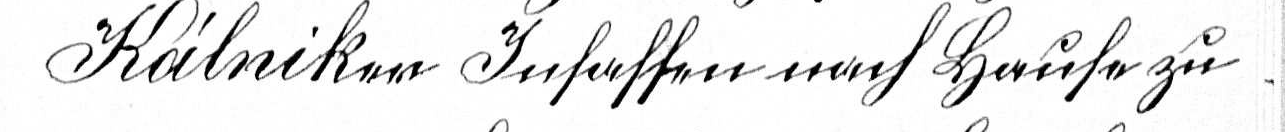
Kálniker Insassen nach Hause zu
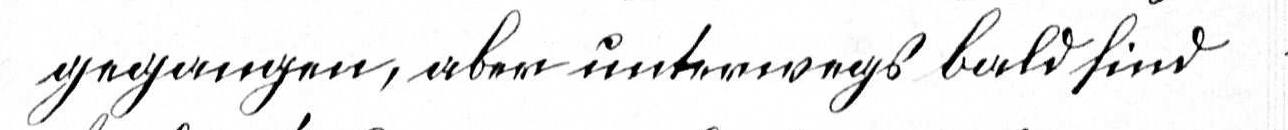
gegangen, aber unterwegs bald sind
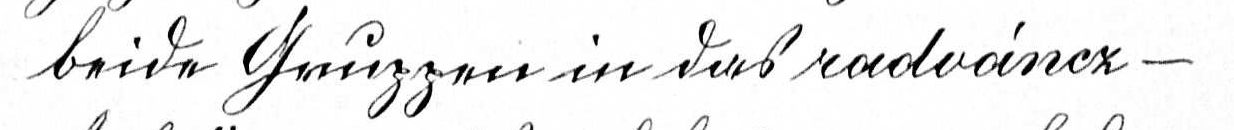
beide Gruppen in das radváncz¬
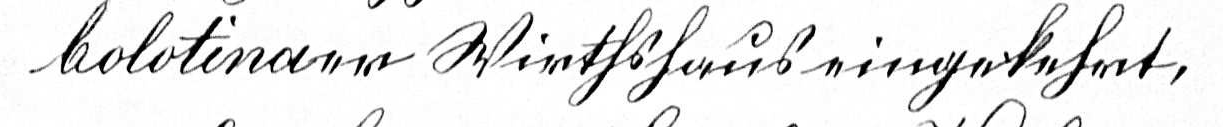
bolotinaer Wirthshauseingekehrt,
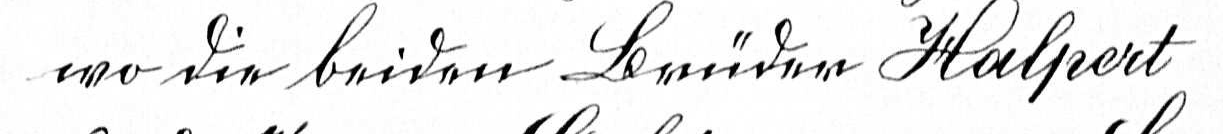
wo die beiden Brüder Halpert
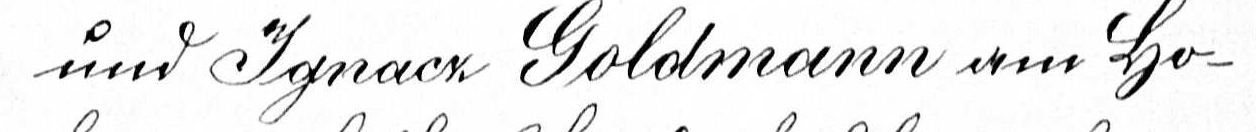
und Jgnacz Goldmann am Ho¬
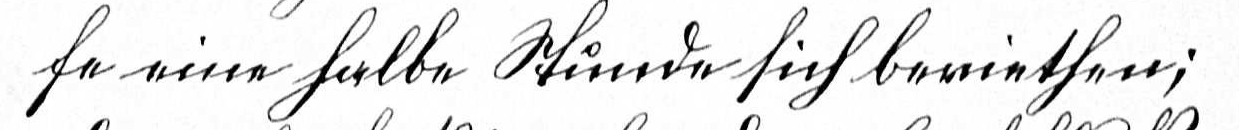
fe eine halbe Stunde sich beriethen;
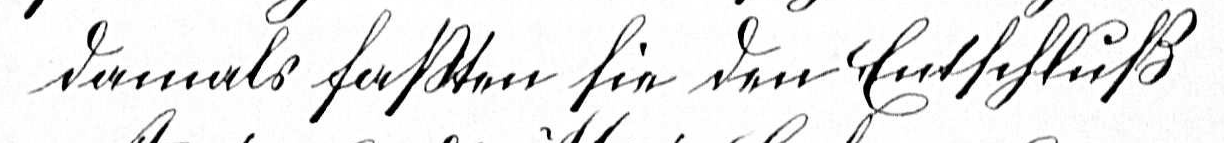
damals faßten sie den Entschluß
